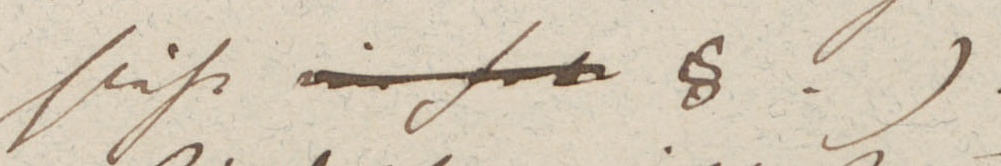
siehe in F § . ).
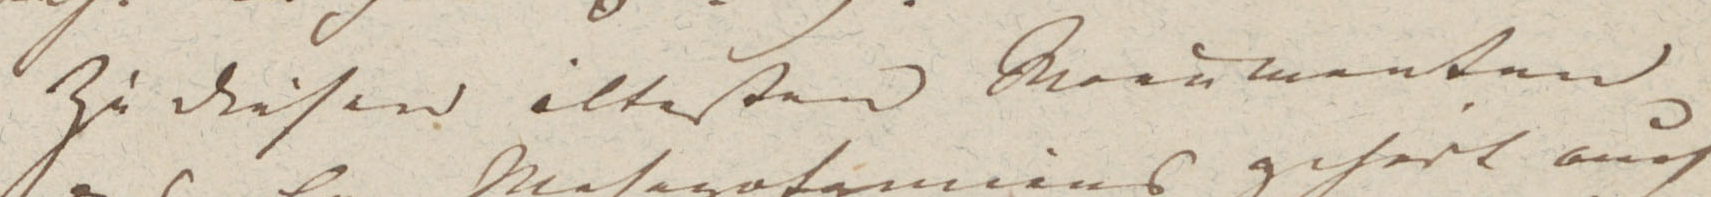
Zu diesen ältesten Monumenten
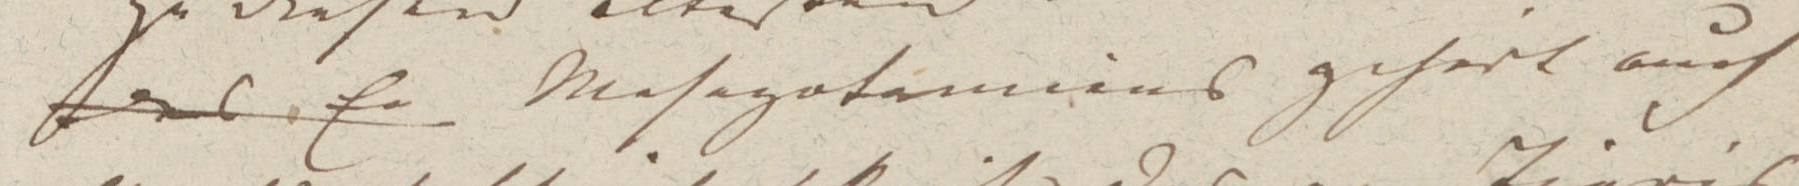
des E Mesopotamiens gehört auch
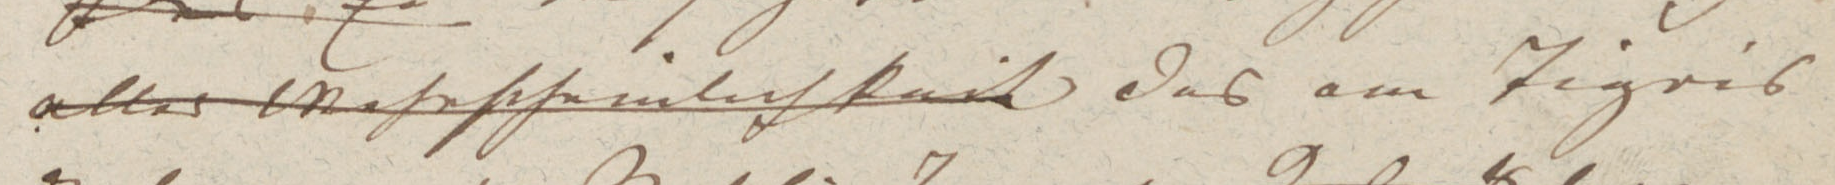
aller Wahrscheinlichkeit das am Tigris
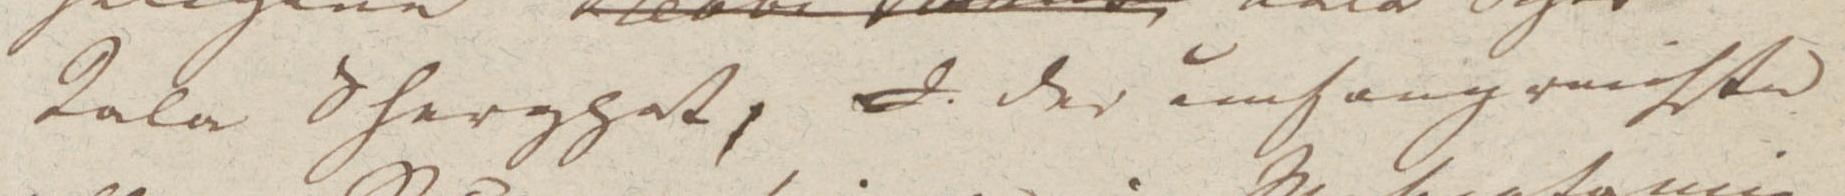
Kala Sherghat der umfangreichste
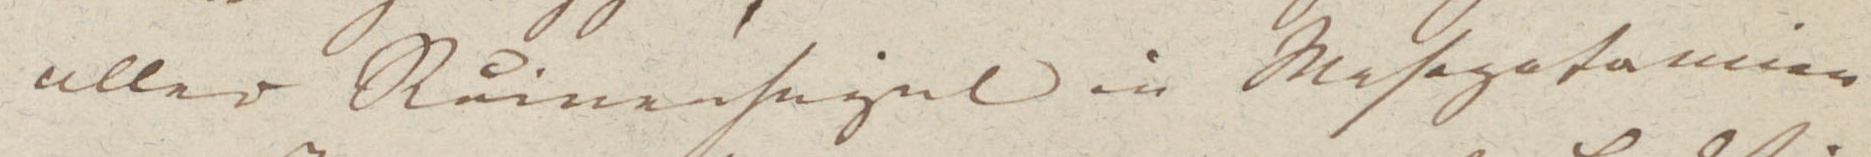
aller Ruinenhügel in Mesopotamien
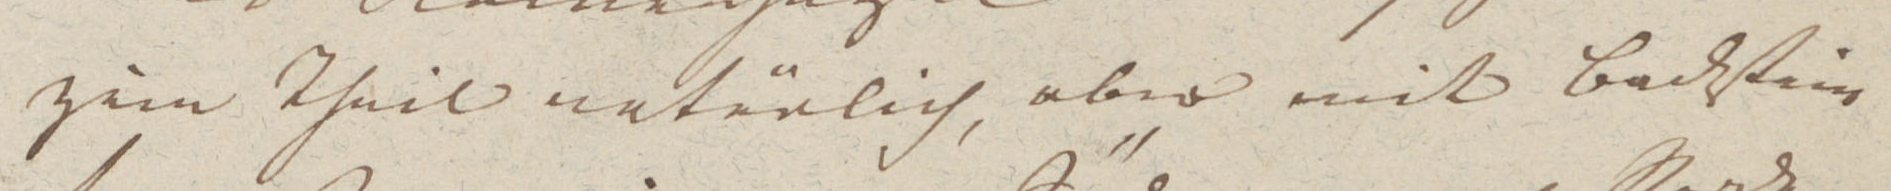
zum Theil natürlich, aber mit Backstein
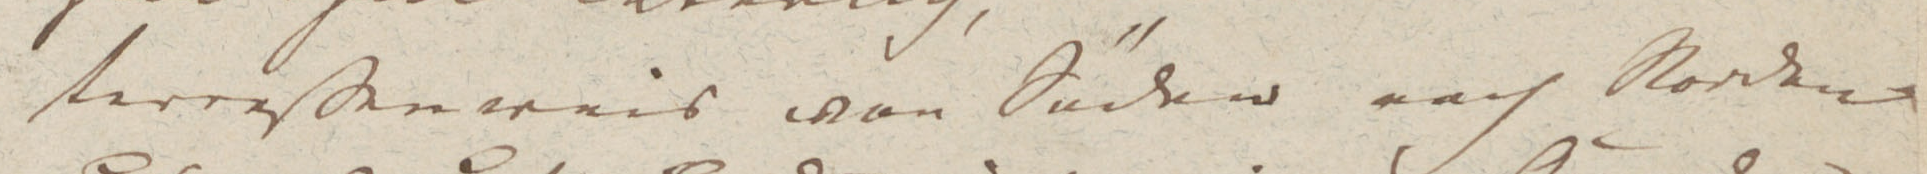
terrassenweis von Süden nach Norden
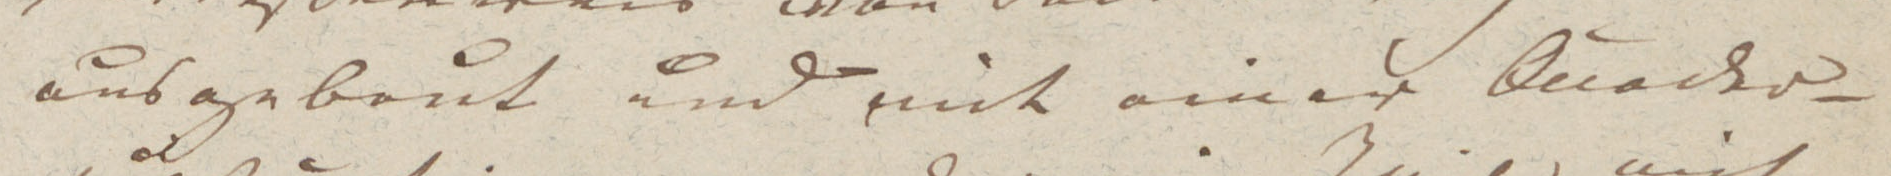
ausgebaut und mit einer Quader-
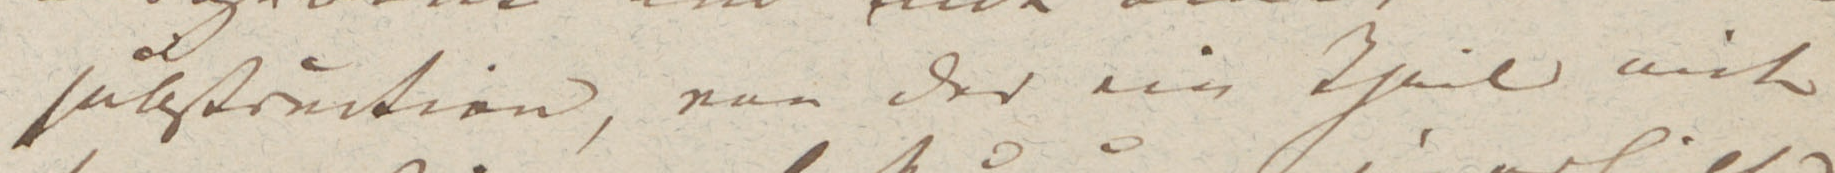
substruction, von der ein Theil mit
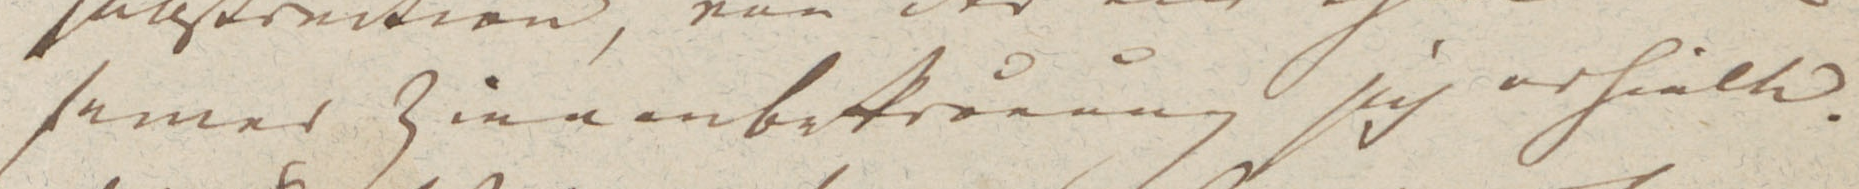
seiner Zinnenbekrönung sich erhielt.
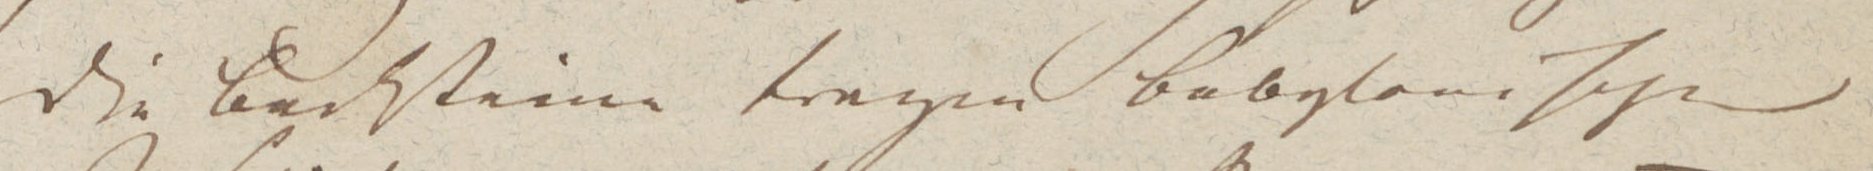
Die Backsteine tragen Babylonische
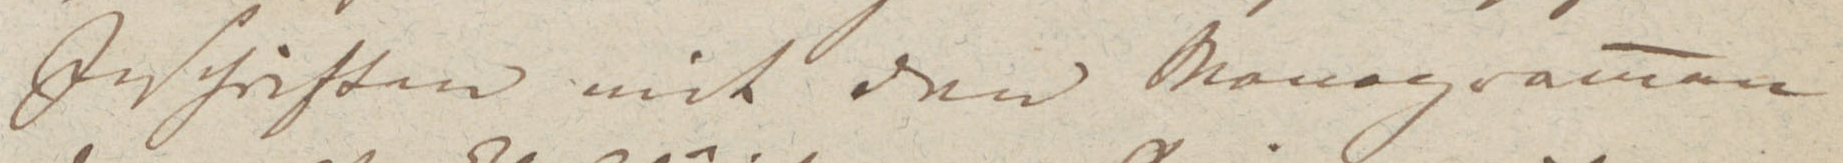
Inschriften mit den Monogrammen
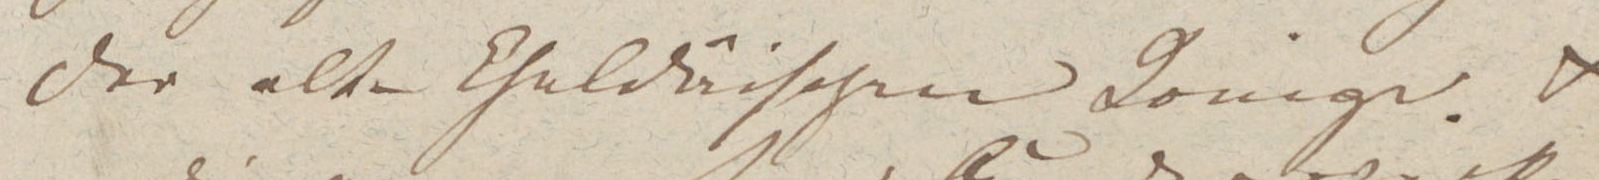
der alt-Chaldäischen Konige. %
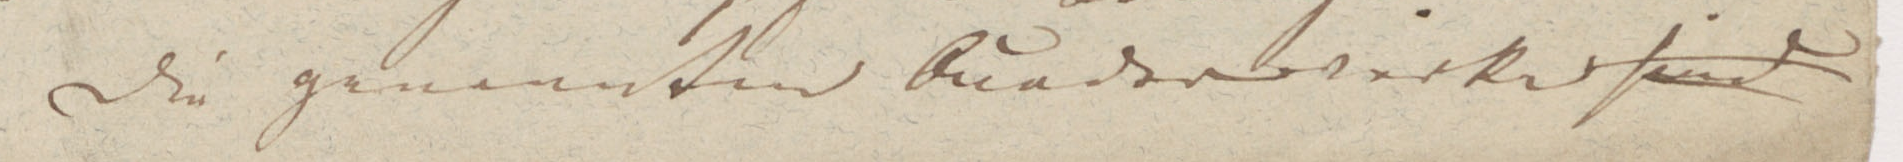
Die genannten Quaderwerke sind
